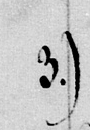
3.)
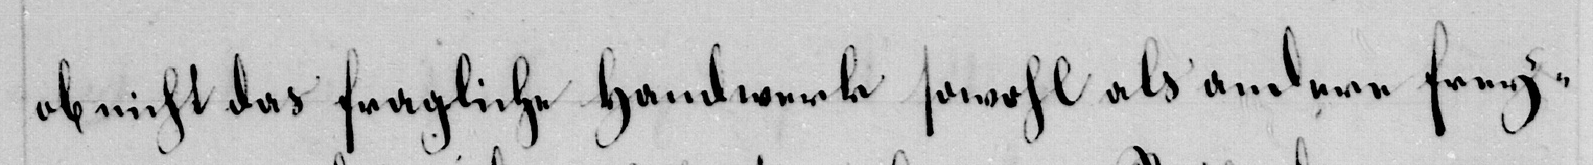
ob nicht das fragliche Handwerk sowohl als andere frey¬
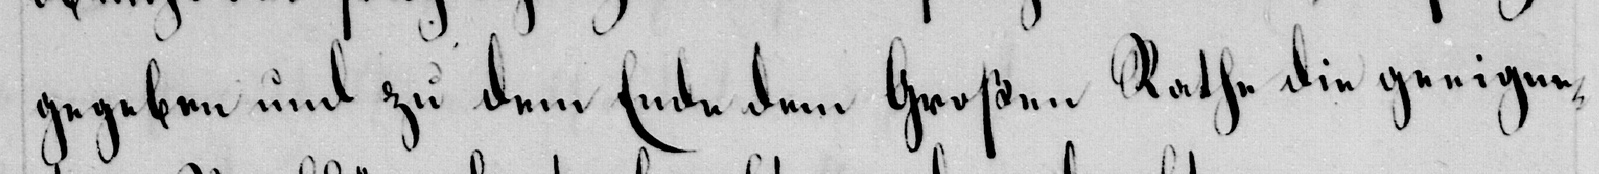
gegeben und zu dem Ende dem Großen Rathe die geeigne¬
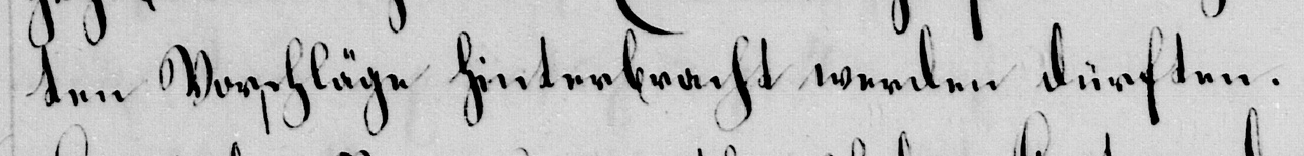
ten Vorschläge hinterbracht werden dürften.
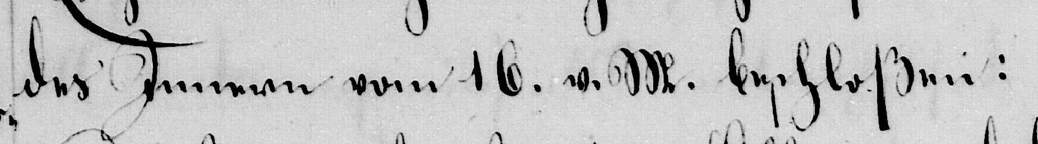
des Innern vom 16. v. M. beschloßen:
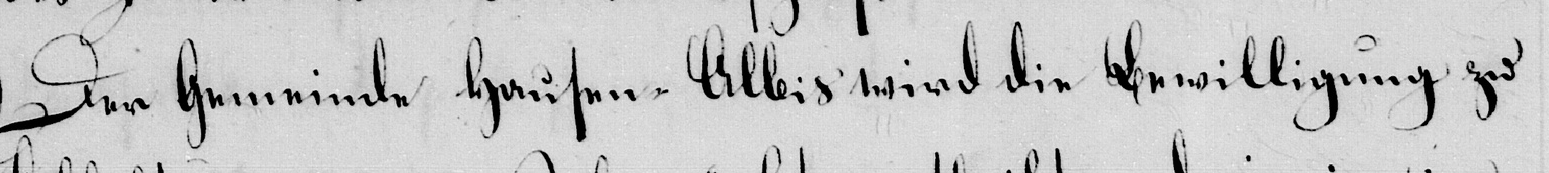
Der Gemeinde Hausen-Albis wird die Bewilligung zu
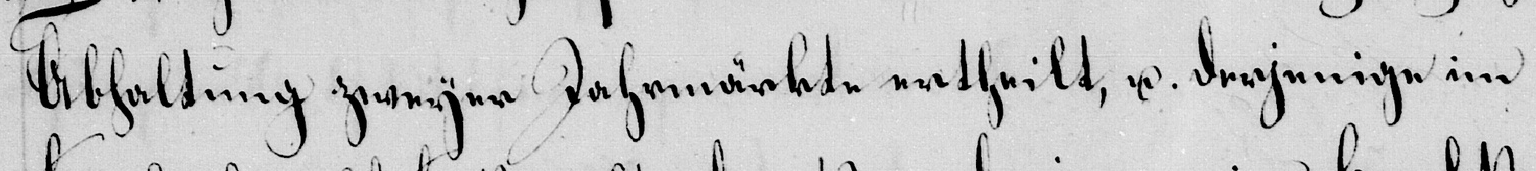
Abhaltung zweyer Jahrmärkte ertheilt, u. derjenige im
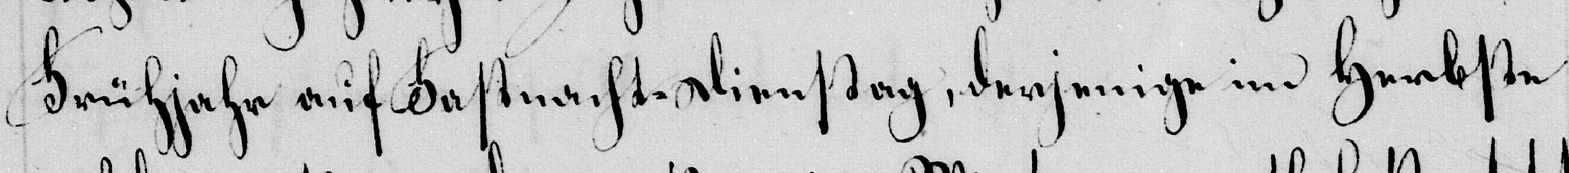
Frühjahr auf Fastnacht-Dienstag, derjenige im Herbste
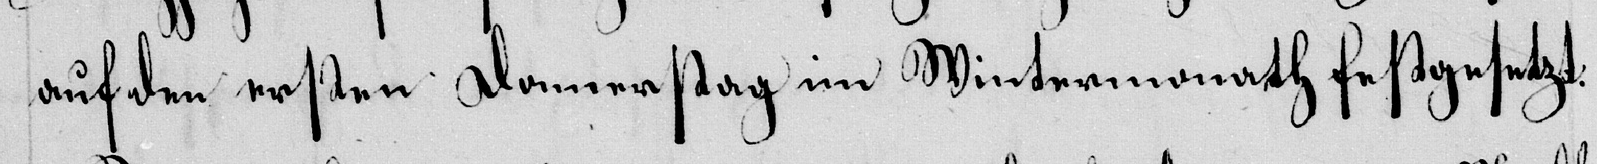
auf den ersten Donnerstag im Wintermonath festgesetzt.
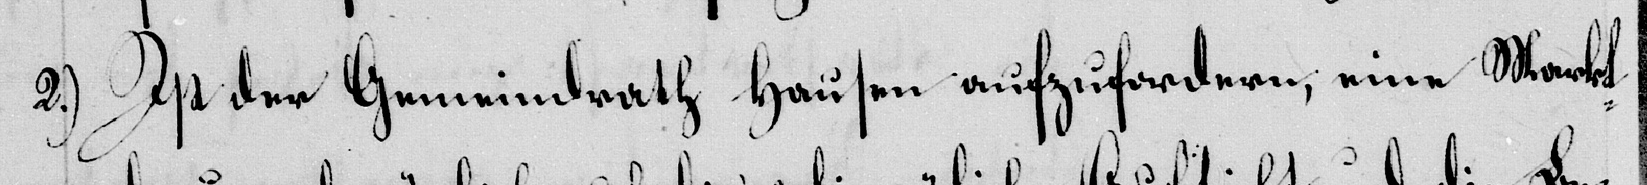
2.) Ist der Gemeindrath Hausen aufzufordern, eine Markt¬
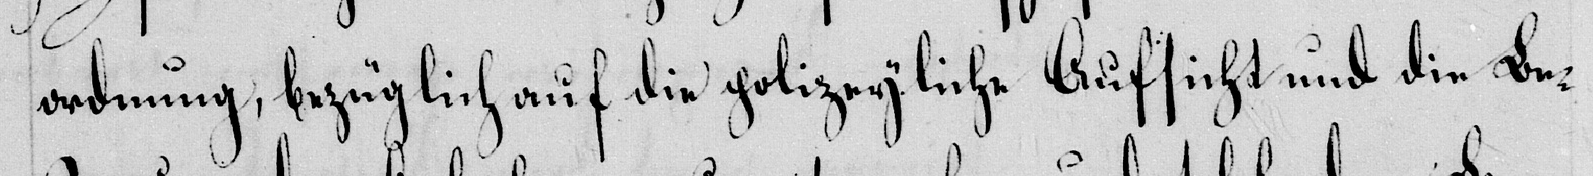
ordnung, bezüglich auf die polizeyliche Aufsicht und die Be¬
